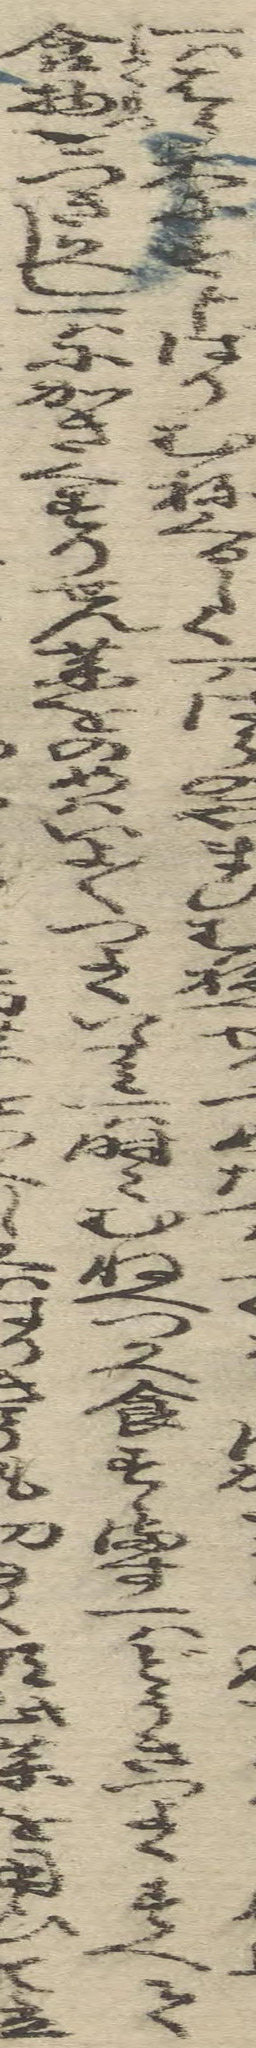食物をつきかへし一はにかきくすりせん薬をのめはいよ〳〵つよくいたみ一は時々むねへつかへ食すゝます一はどうきつよくすへて
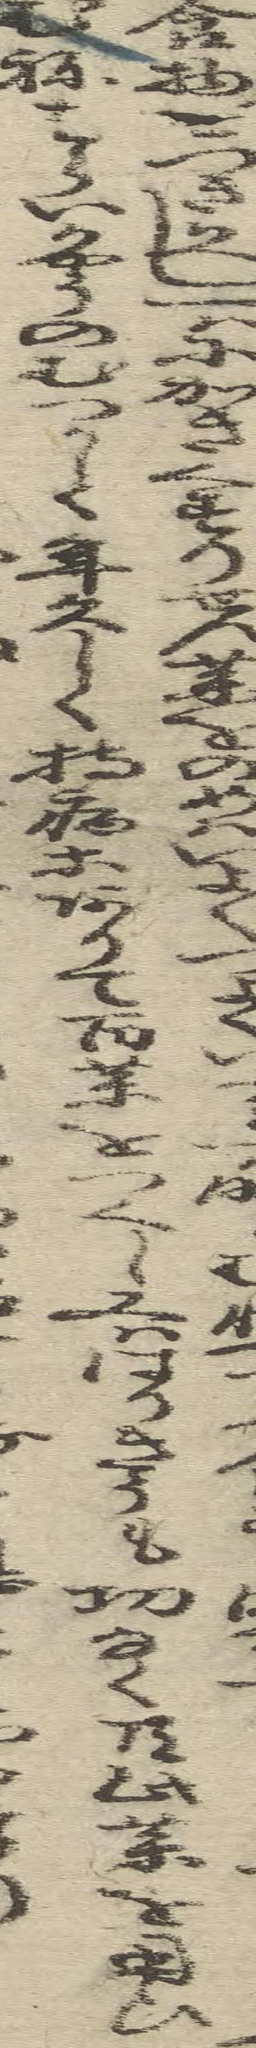むねはらいかやうのむつかしく年久しく持病等ありて百薬をつくし又ははりきうも功なく共此薬を用ひて立
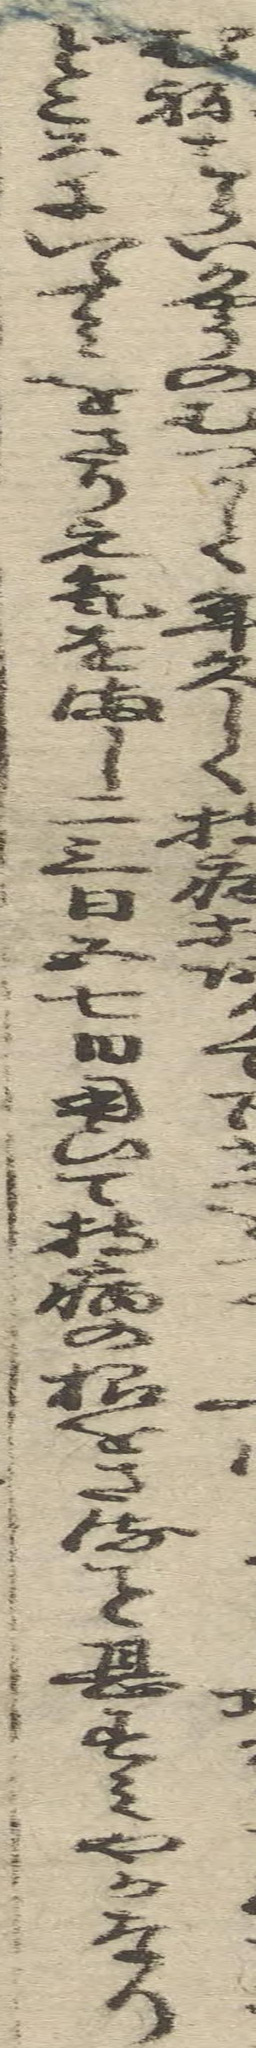どころにいたみをさり元気をまし二三日五七日用ひて持病の根をさること甚すみやかなり
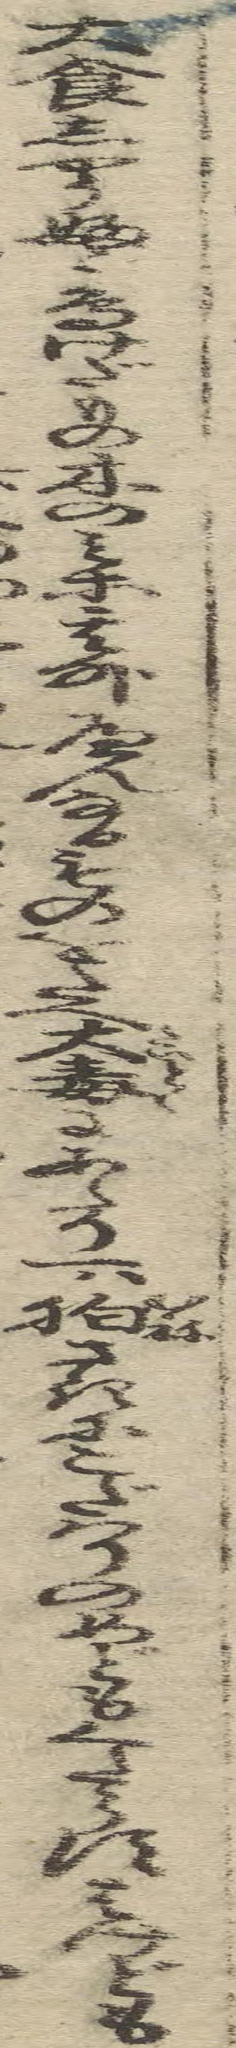大食しやうふく鳥けだもの木のみ等其外へんなるものをたへ大毒にあたり一は胸さきにこだはりのめどもくたらすはけども
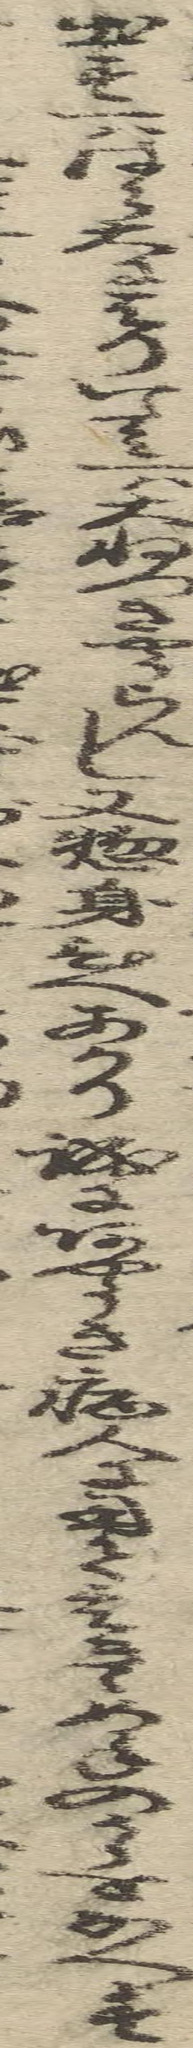出す一ははら大にはりいたみ一は大ねつきやうらんし又惣身ひへあかり誠にあやうき病人に用て其きゝめ手のかうをかへす
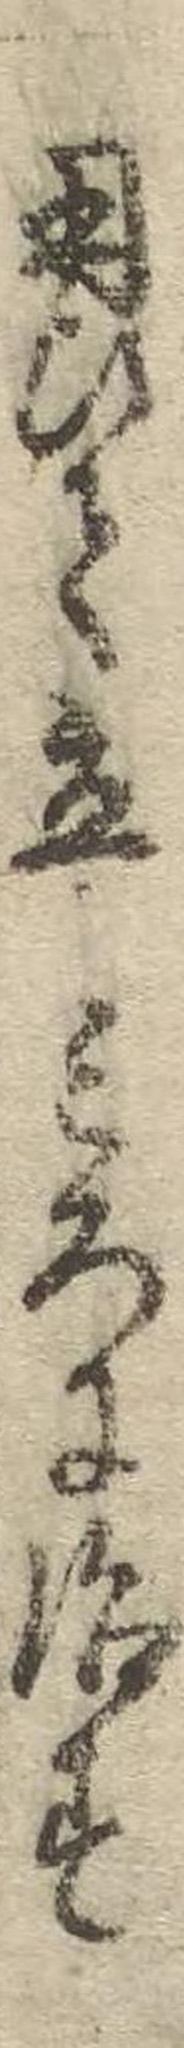用ひて立ところに治す
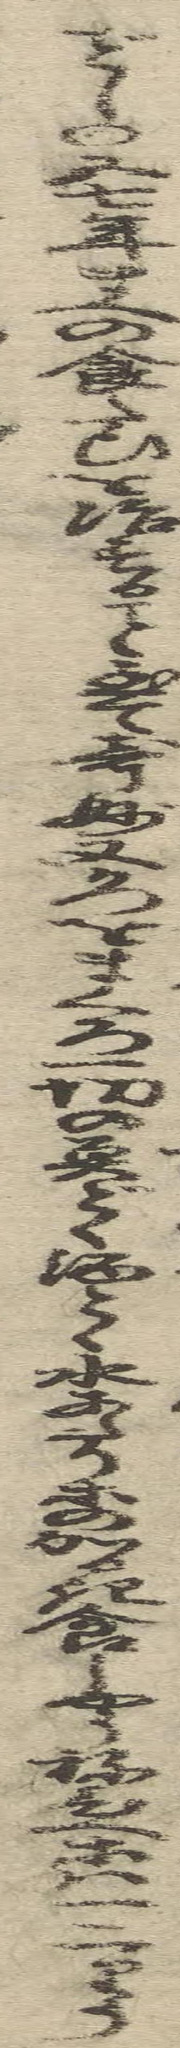ごとし〇五七年まえの食たひを治すること至て奇妙又かつをまくろ一切の魚どく酒とく水あたり等のかるき食しやうねひへ等は一二りう
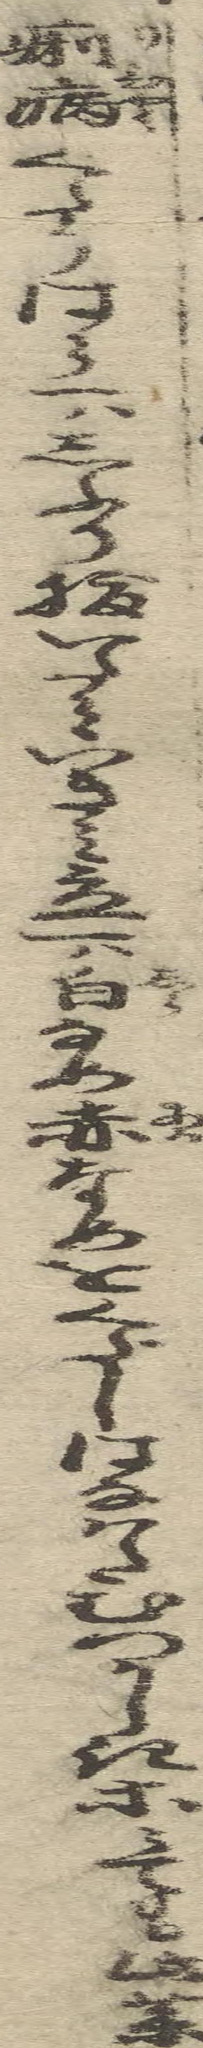痢病くたりはら一はしふり腹いたみいきみ立一は白なめ赤なめをくだしはなはたむつかしき等にても此薬
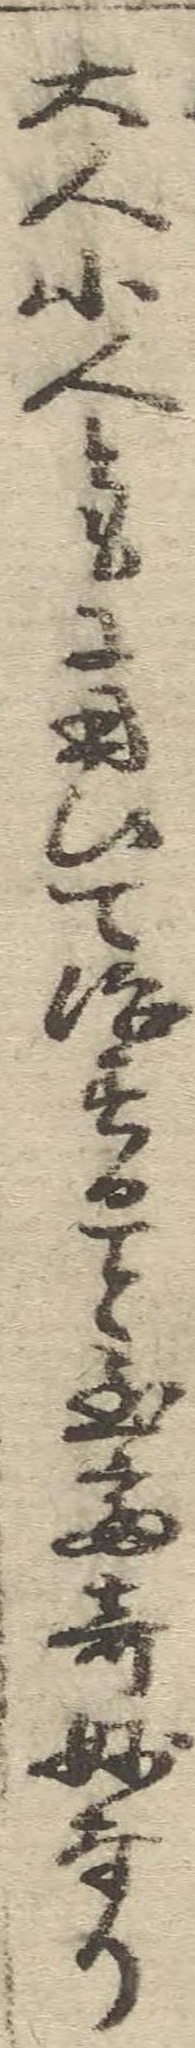大人小人ともに用ひて治すること至て奇妙なり
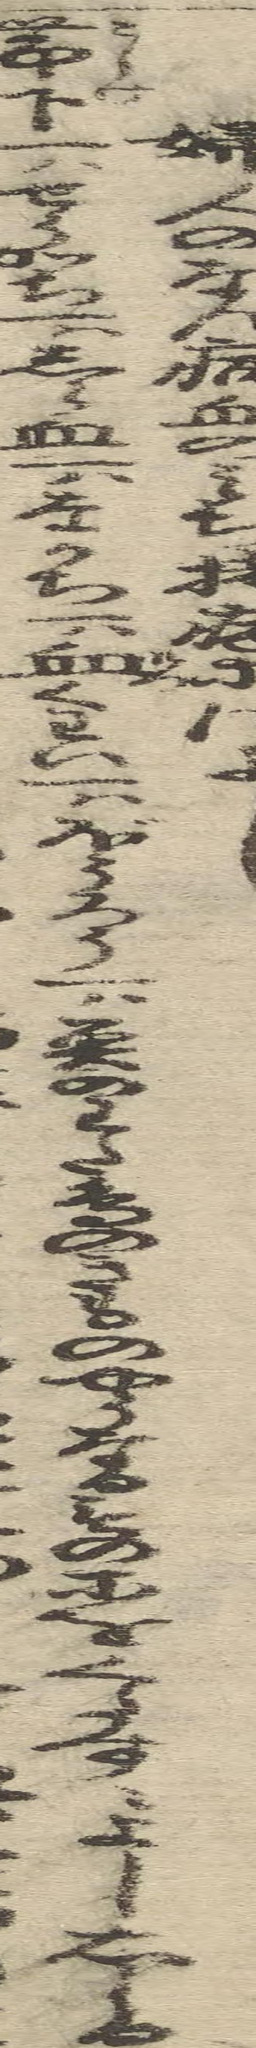帯下一はせうかち一はしら血一はなかち一は血くわい一はぼうろう一は魚のわた鳥のきものやうなるもの等をくたすによし右しる
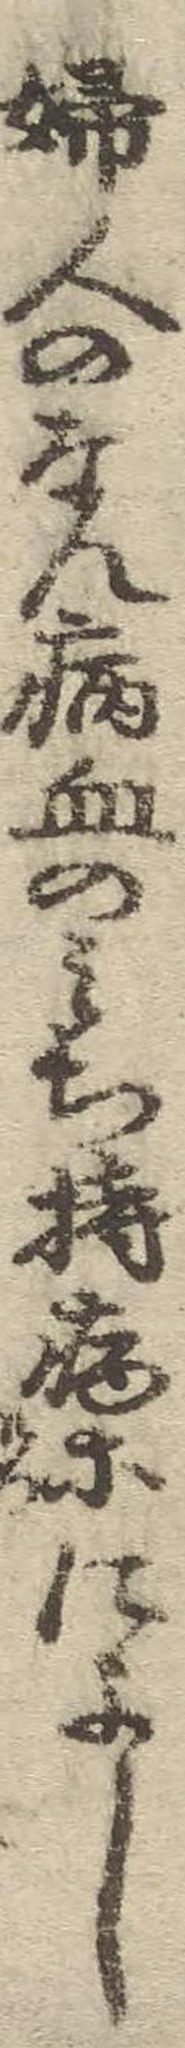婦人のなん病血のみち持病等によし
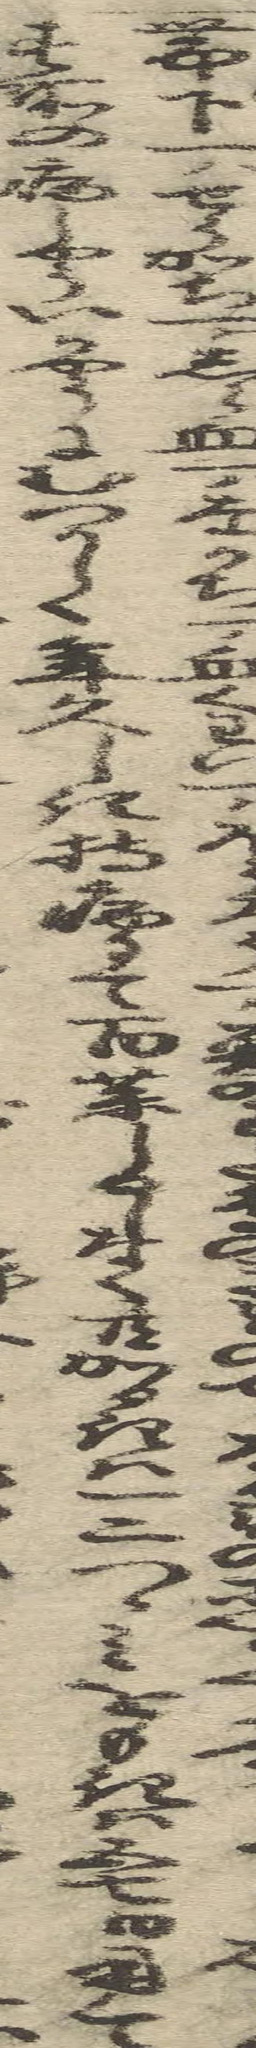す所の病しやういかやうにむつかしく年久しき持病にて百薬しるしなく共かるきは一ニつゝみをもきは五七日用て
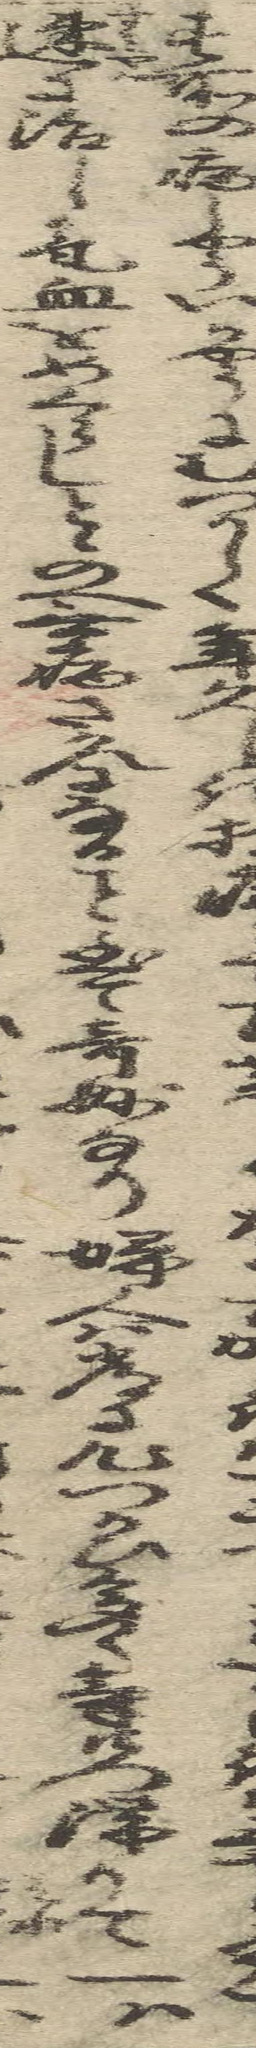速に治し気血をめくらしとゝのへ無病さかんになること至て奇妙なり婦人は常に心つかひ多く気けつ滞りて一は
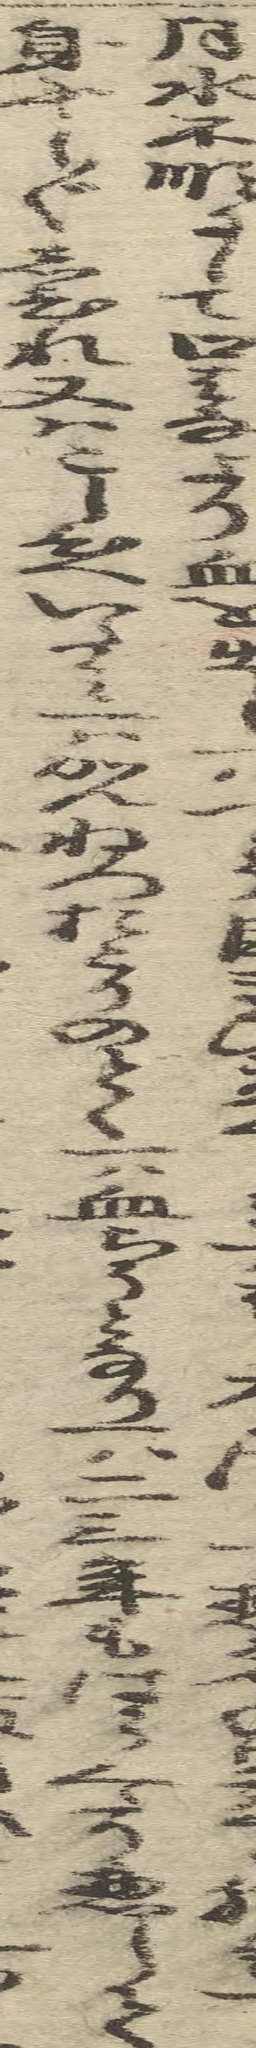身ふし〴〵しひれ又はこしひへいたみ一はかんねつおこりのどく一は血らうとなり一はニ三年もはらくたり惣して
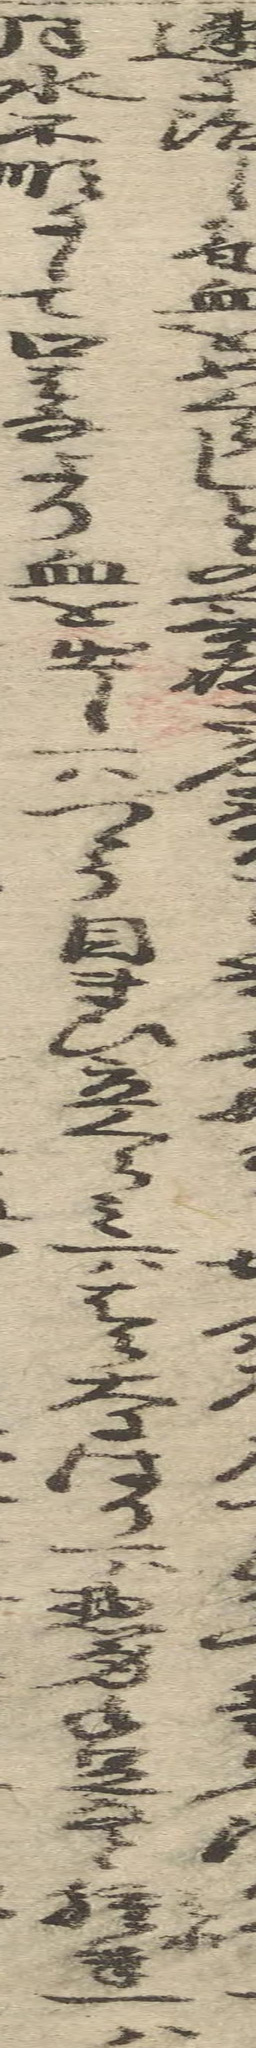月水不順にして口はなより血を出し一はづゝう目まひ立くらみ一ははら大にはり一は惣身手足なと腫気一は
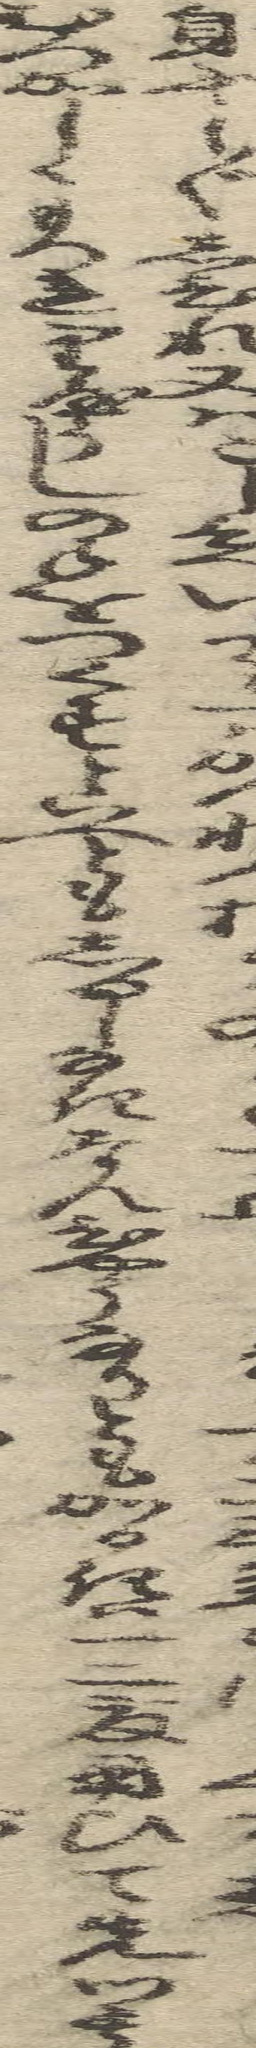むつかしくもつれりやうしの手をつくすといへともしるしなきなんひやうなりともかるきは一ニ度用ひて先つ其
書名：浪華薬種問屋能書張交帖. 二
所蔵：国立国会図書館 National Diet Library, JAPAN
